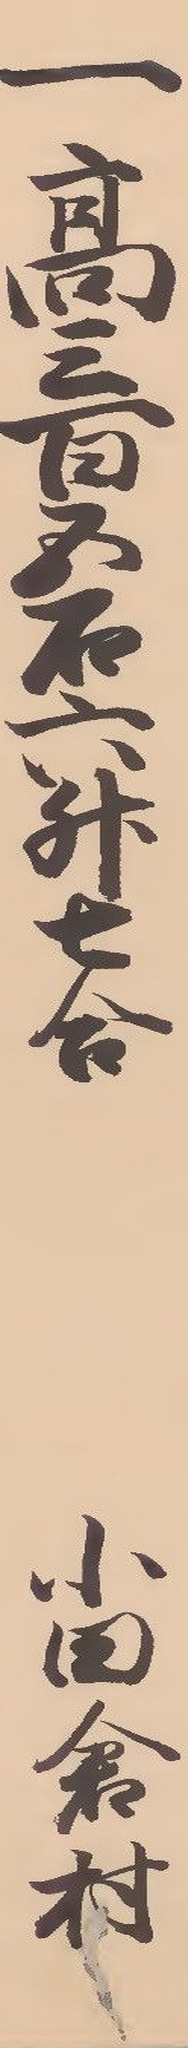一高三百五石六升七合小田倉村
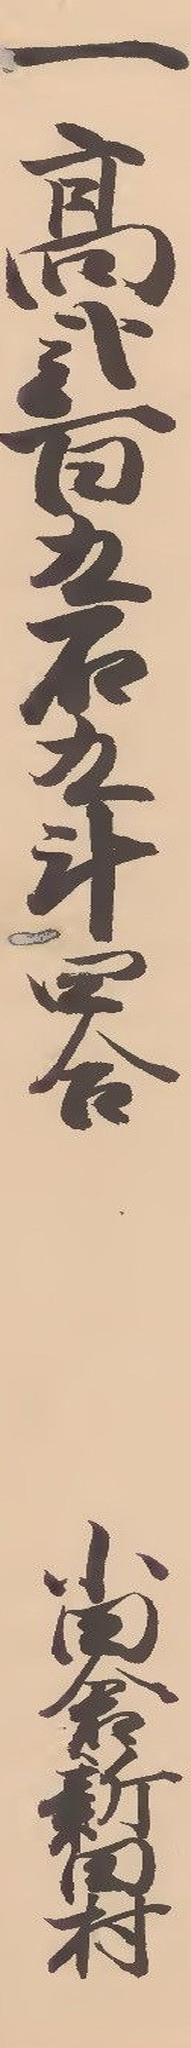一高弐百九石九斗四合小田倉新田村

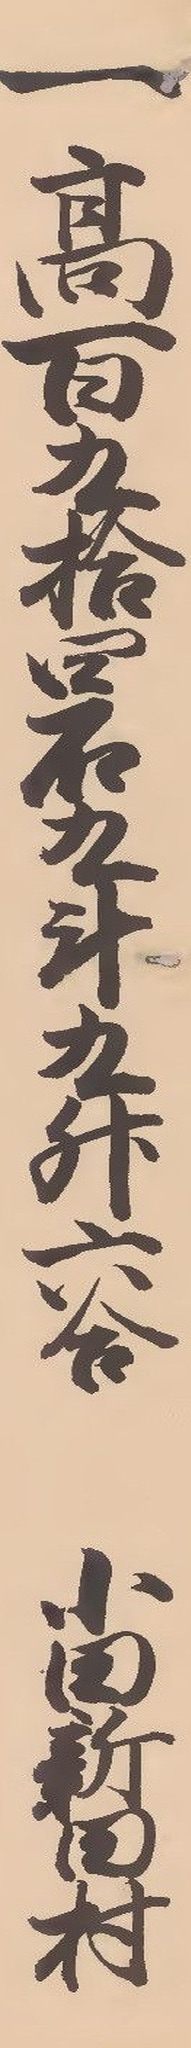一高百九拾四石九斗九升六合小田新田村
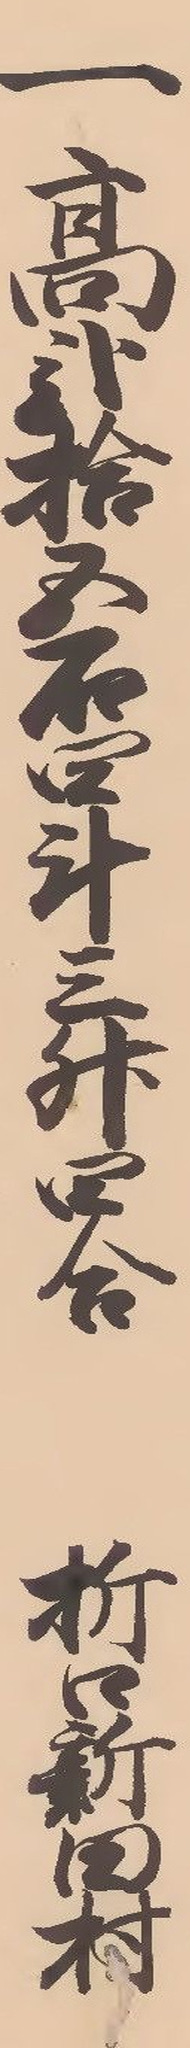一高弐拾五石四斗三升四合折口新田村
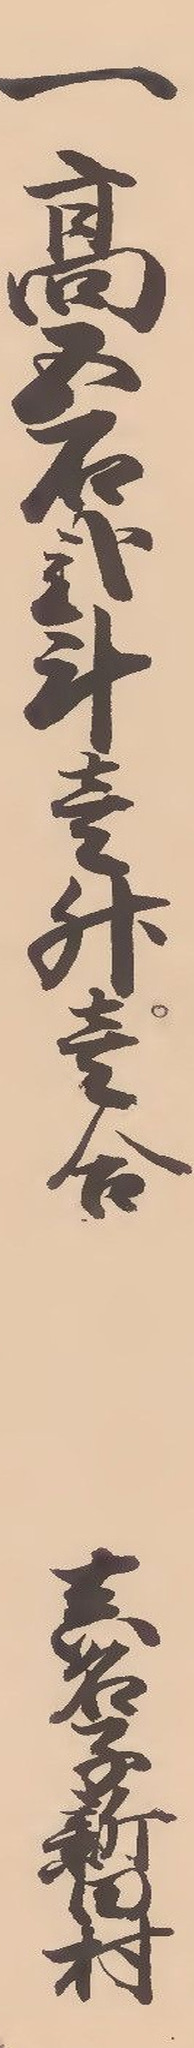一高五石弐斗壱升壱合真名子新田村
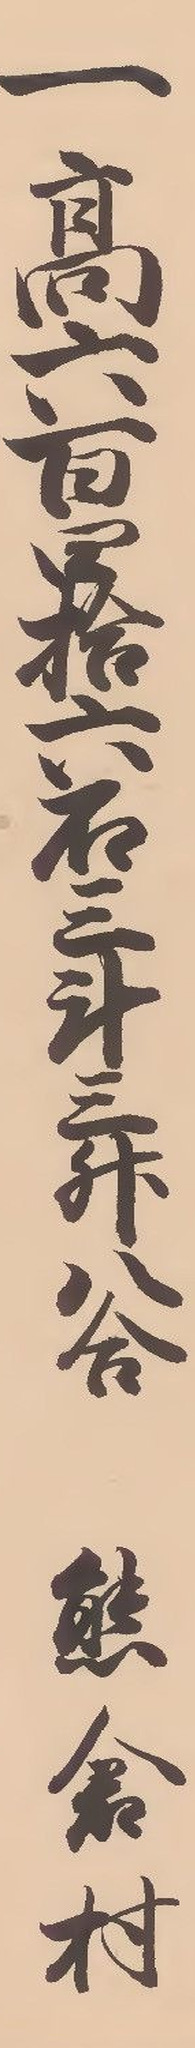一高六百四拾六石三斗三升八合熊倉村
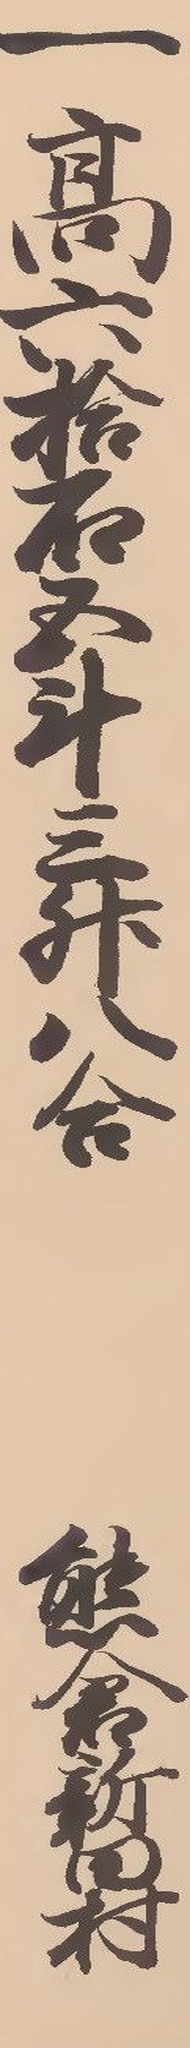一高六拾石五斗三升八合熊倉新田村
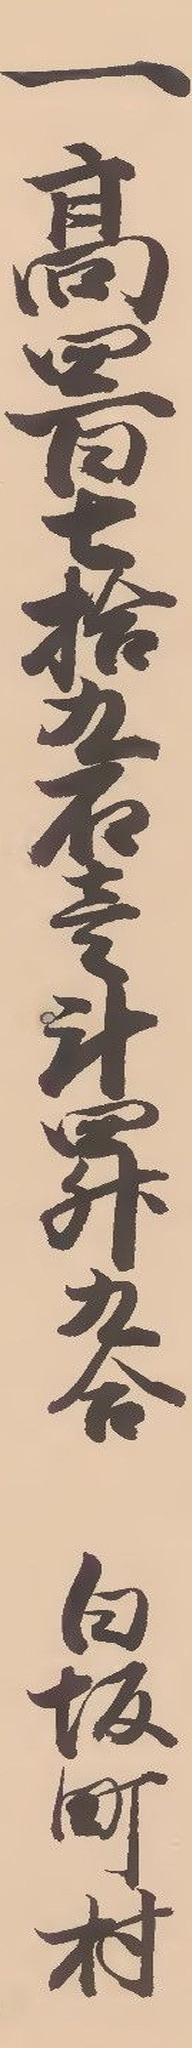一高四百七拾九石壱斗四升九合白坂町村
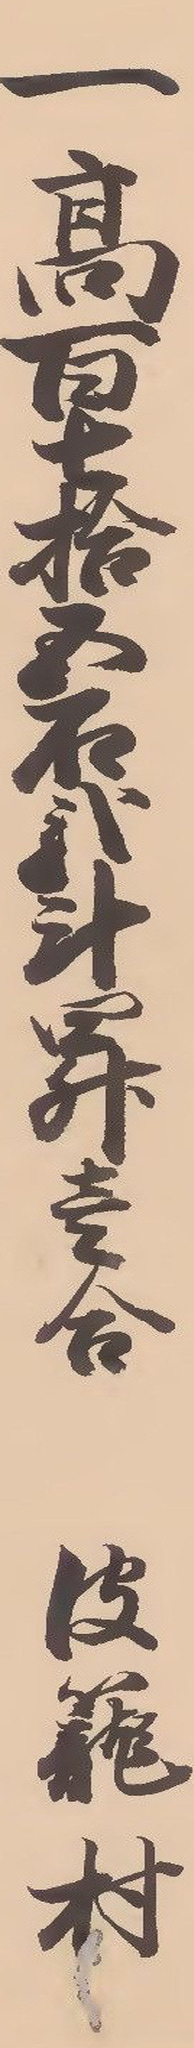一高百七拾五石弐斗四升壱合皮篭村
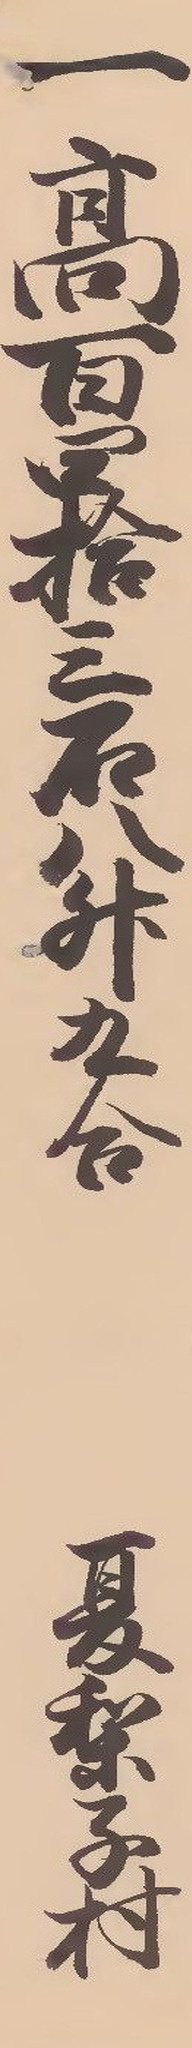一高百四拾三石八升九合夏梨子村

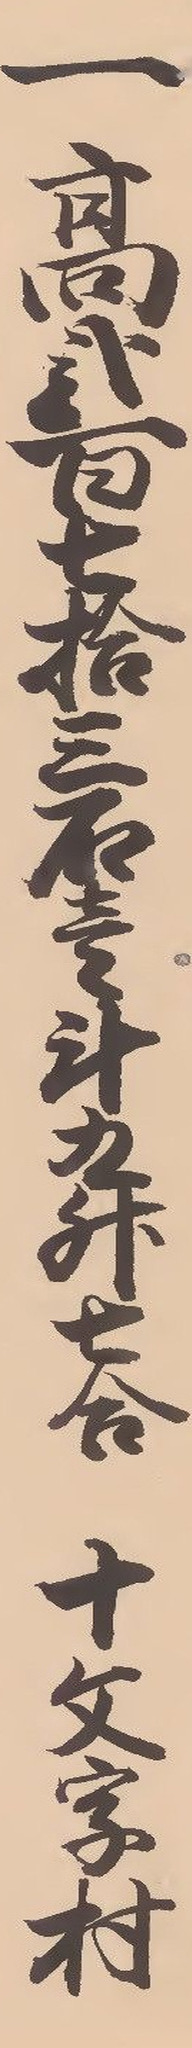一高弐百七拾三石壱斗九升七合十文字村
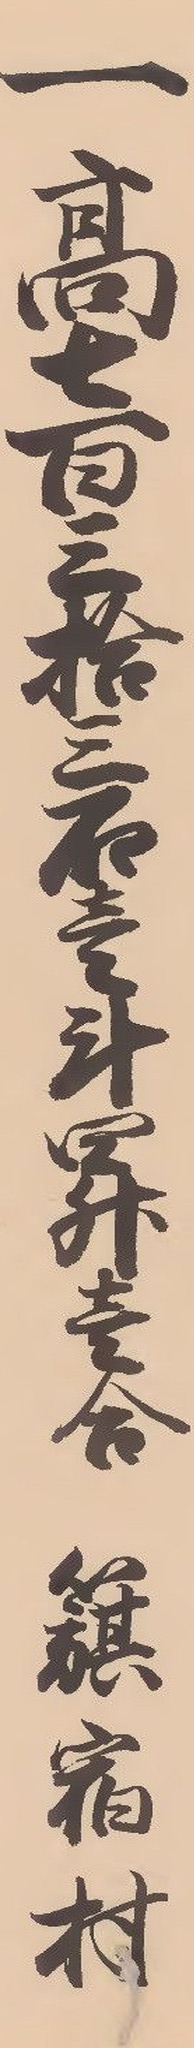一高七百三拾三石壱斗四升壱合籏宿村
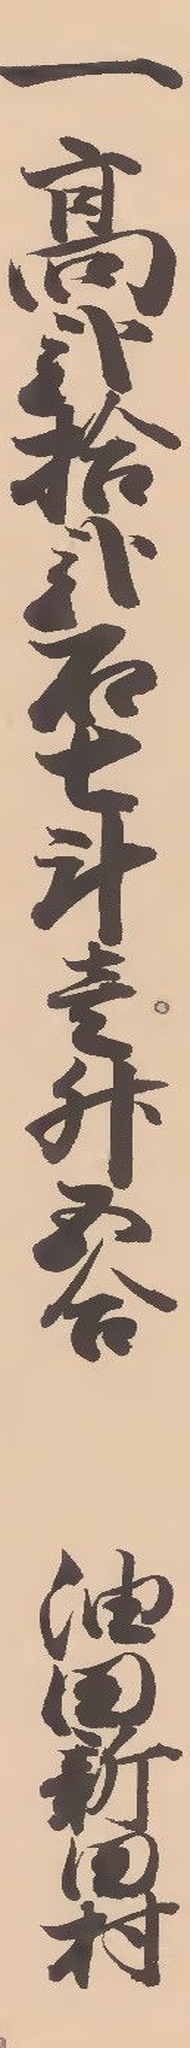一高弐拾弐石七斗壱升五合油田新田村
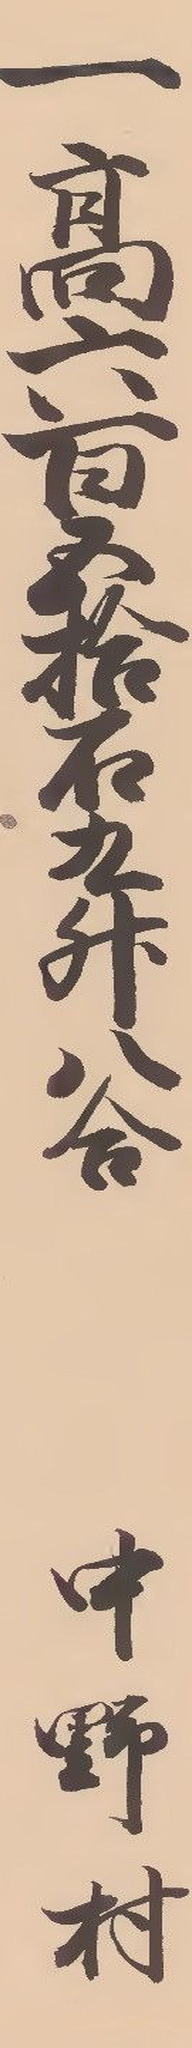一高六百五拾石九升八合中野村
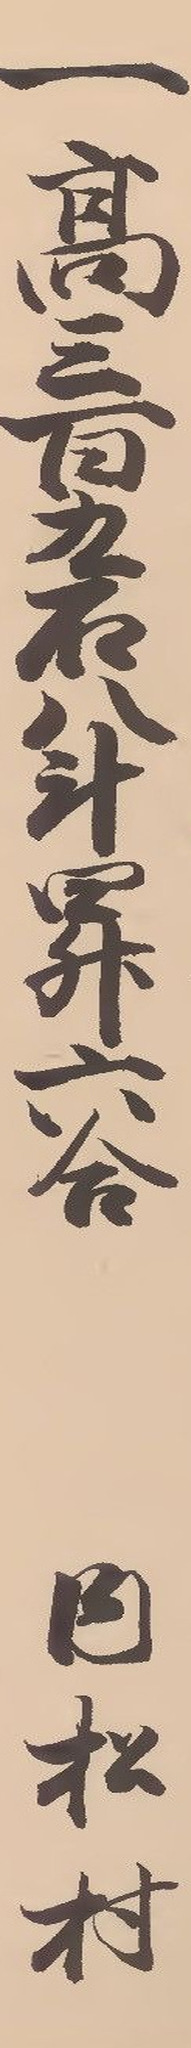一高三百九石八斗四升六合内松村
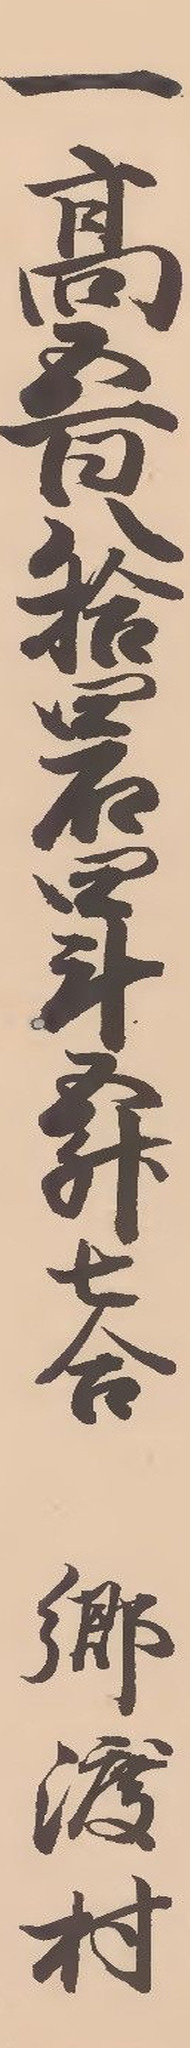一高五百八拾四石四斗五升七合郷渡村
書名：陸奥国郷帳　２
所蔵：国立公文書館 National Archives of Japan
